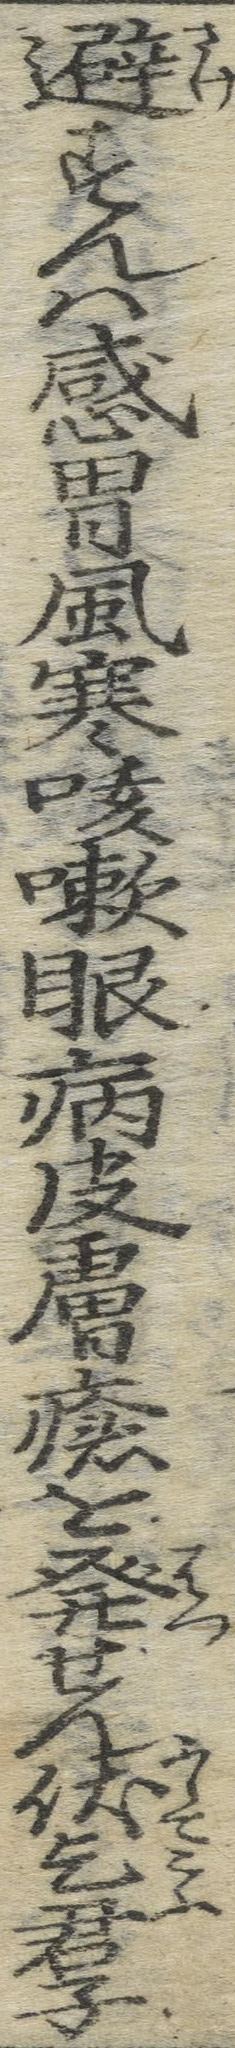避すんは感胃風寒咳嗽眼病皮膚瘡を発せん依乞君子
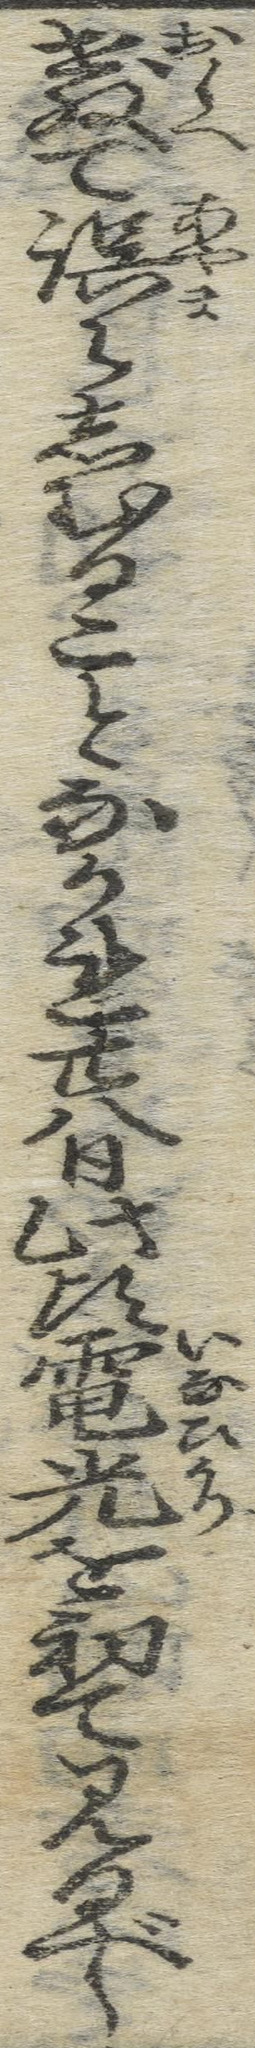教て誤らしむることなかれ廿八日此頃電光を初て見るべし
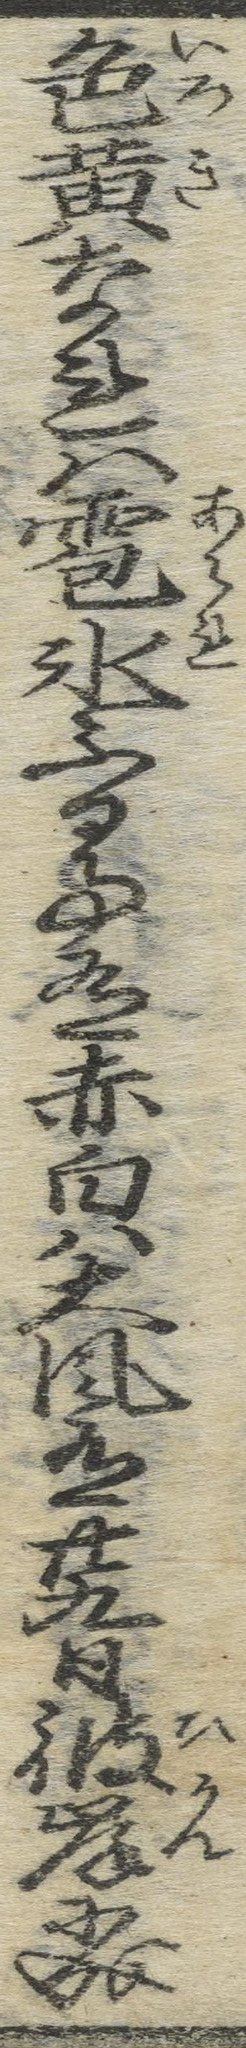色黄なれは雹氷ふる事有赤白は大風有廿九日彼岸に成
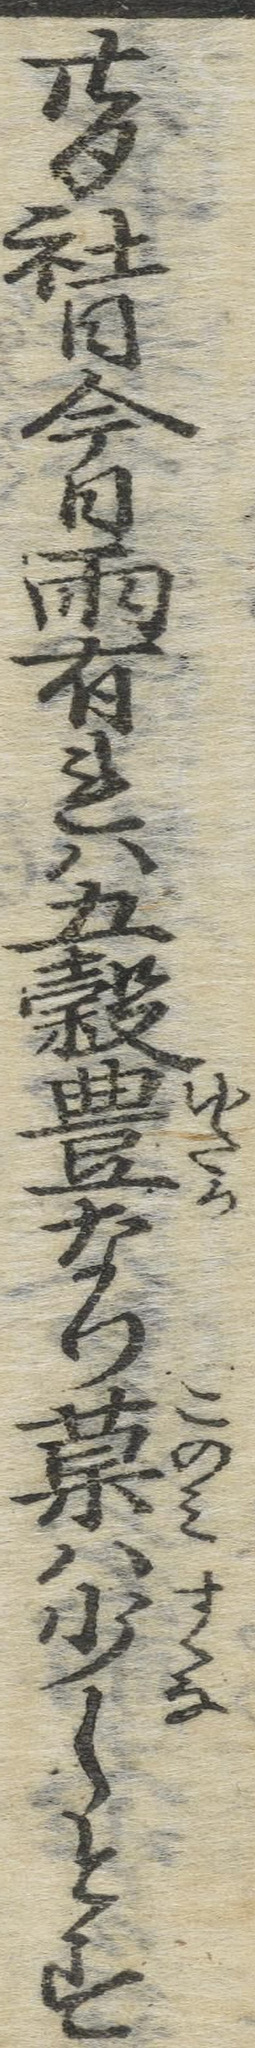廿日社日今日雨有れは五穀豊なり菓は少しとす
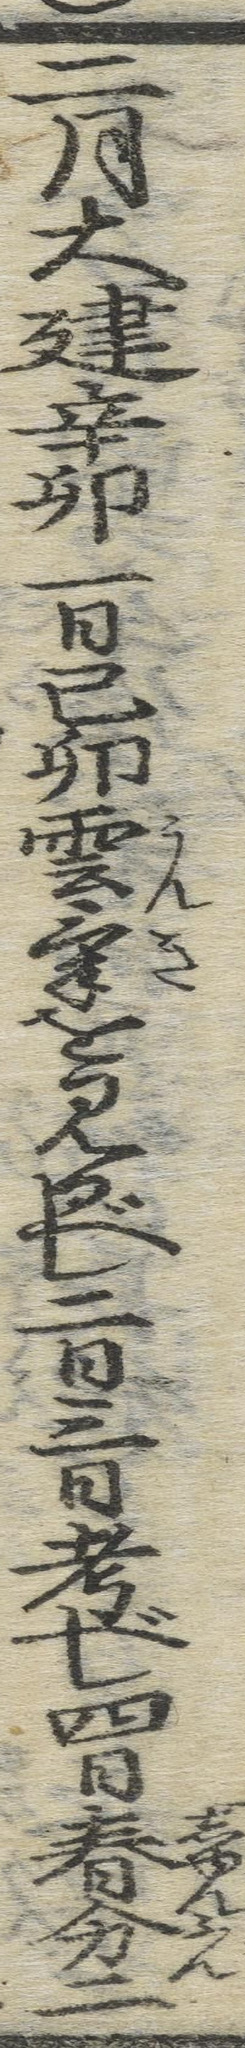二月大建辛卯一日己卯雲気を見るべし二日三日考べし四日春分二
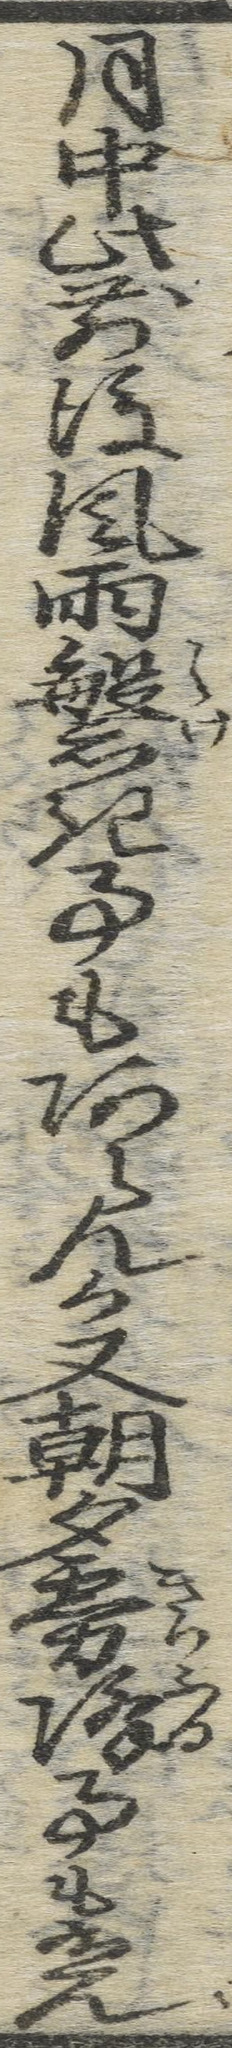月中此前後風雨繁き事もあらんか又朝夕霧降事も有ん
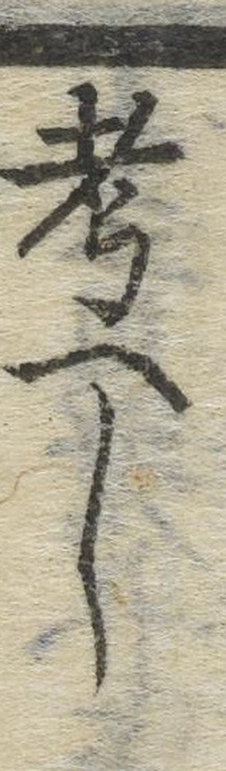考へし
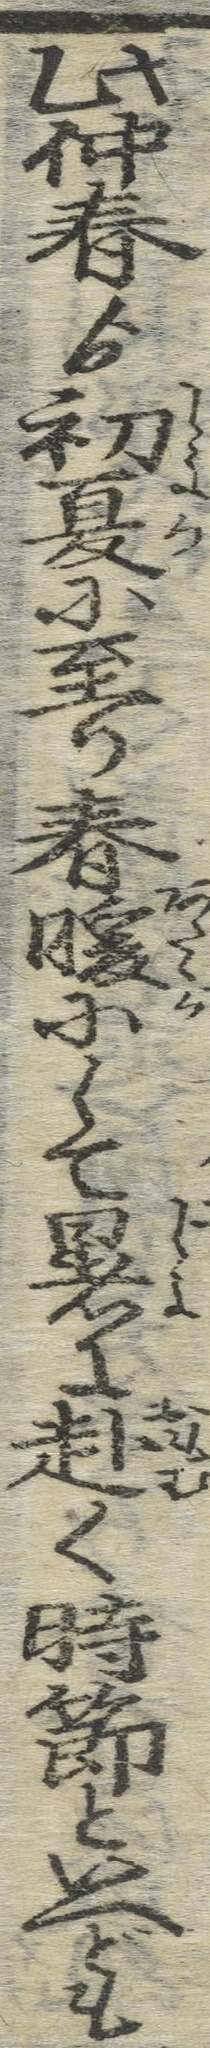此仲春ゟ初夏に至り春暖にして暑に赴く時節といへども
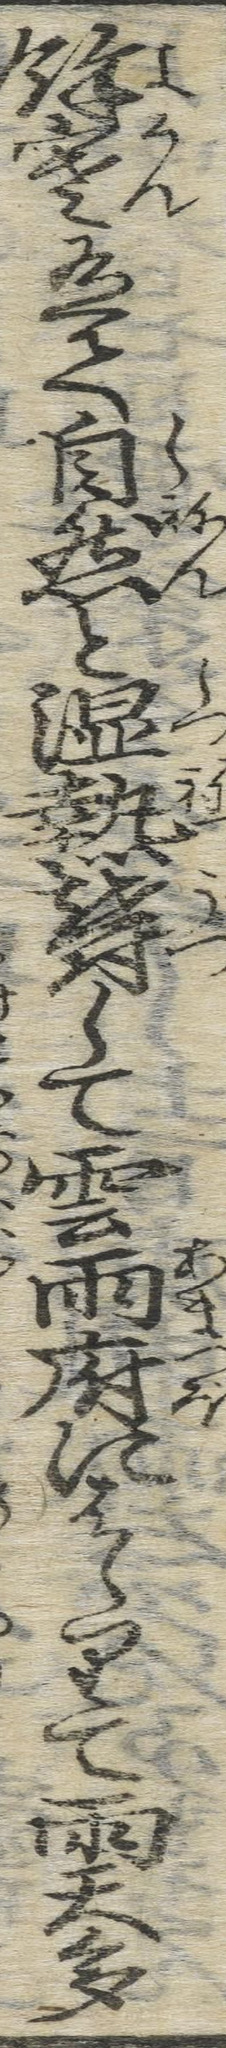余寒有く自然と湿熱移して雲雨府にはゝりて雨天多
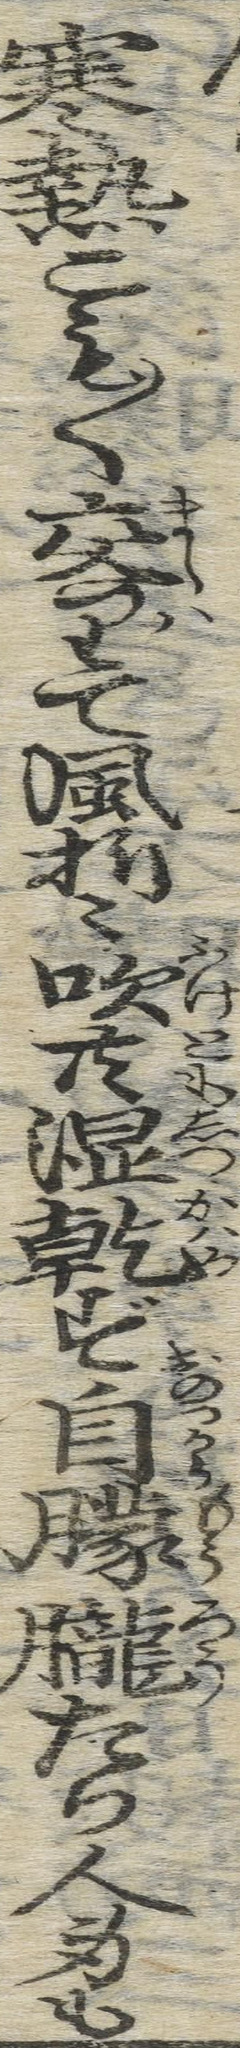寒熱こも〳〵交りて風折〻吹共湿乾ず自朦朧たり人身も
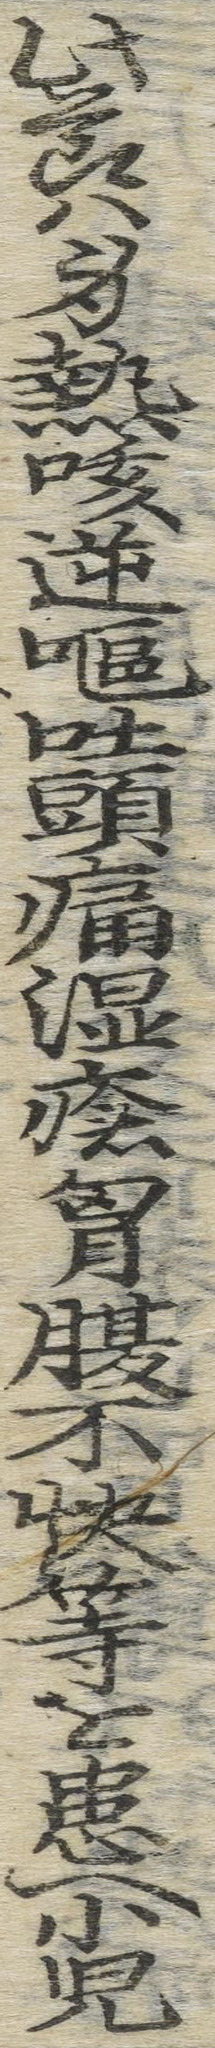此前は身熱咳逆嘔吐頭痛湿瘡胃腹不快等を患へ小児
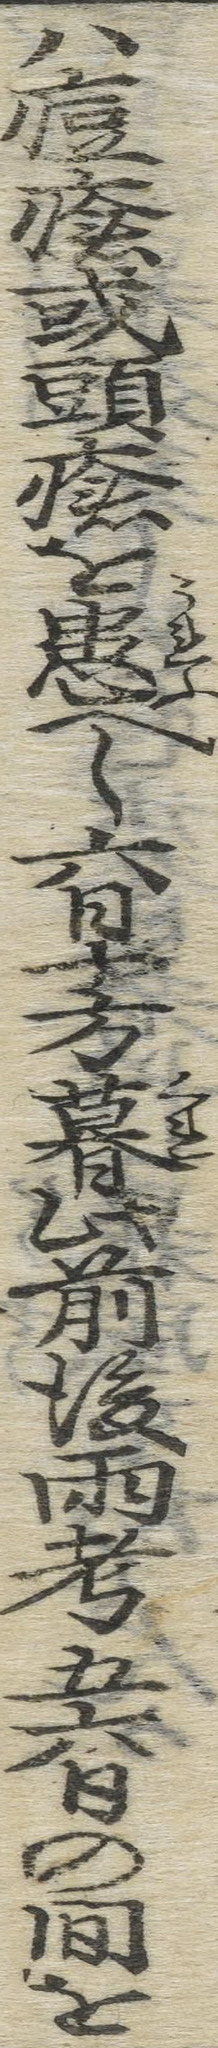は痘瘡或頭瘡を患へし六日十方暮此前後雨考五六日の間を
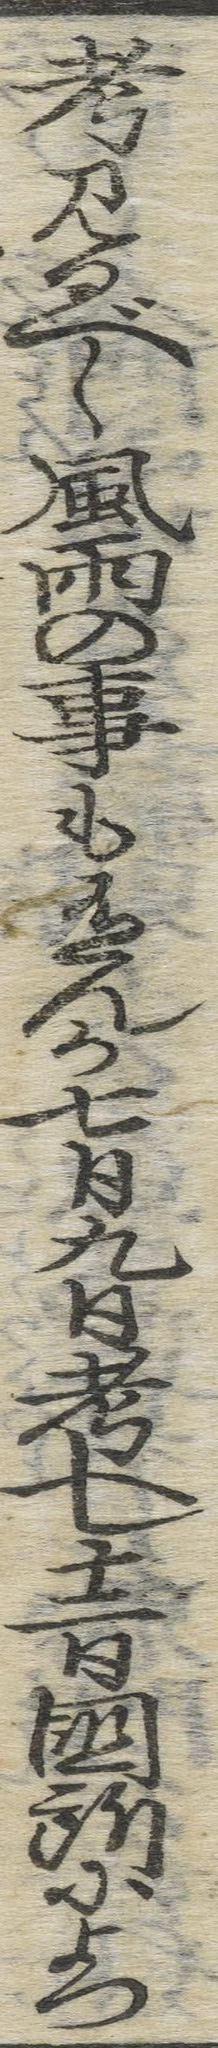考見るべし風雨の事も有んか七日九日考へし十二日国所によつ
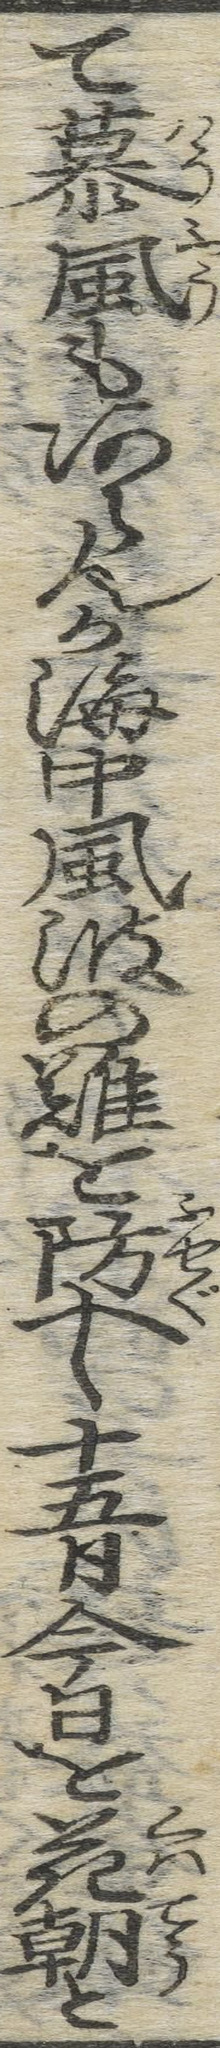て慕風もあらんか海中風波の難を防へし十五日今日を花朝と
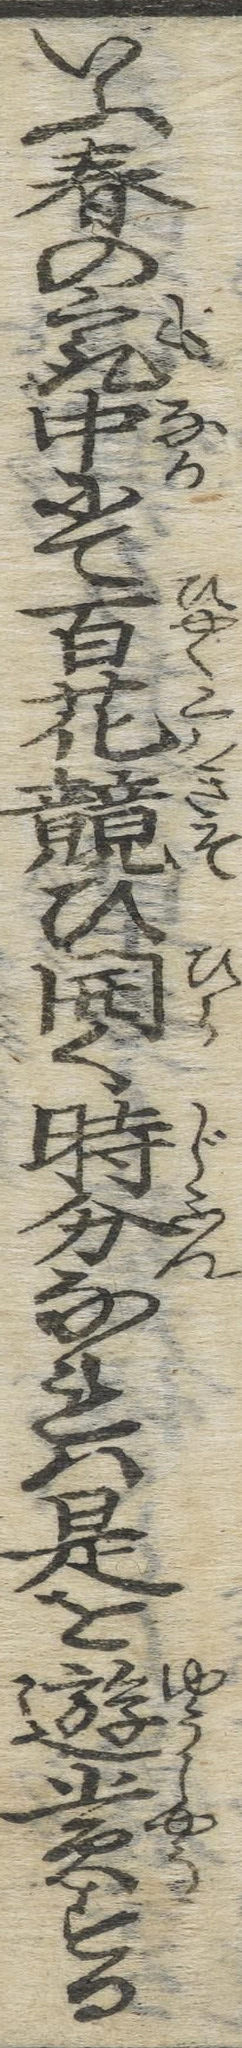いふ春の最中にて百花競ひ開く時分なれは是を遊賞する
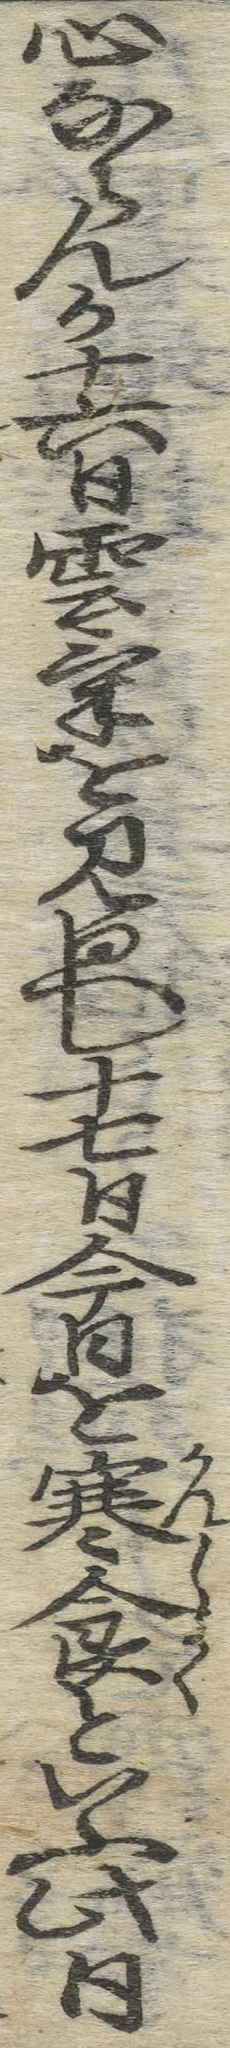心ならんか十六日雲気を見るへし十七日今日を寒食といふ此日
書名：[晴雨考]
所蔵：東京大学地震研究所図書室 Earthquake Research Institute Library, The University of Tokyo, JAPAN
